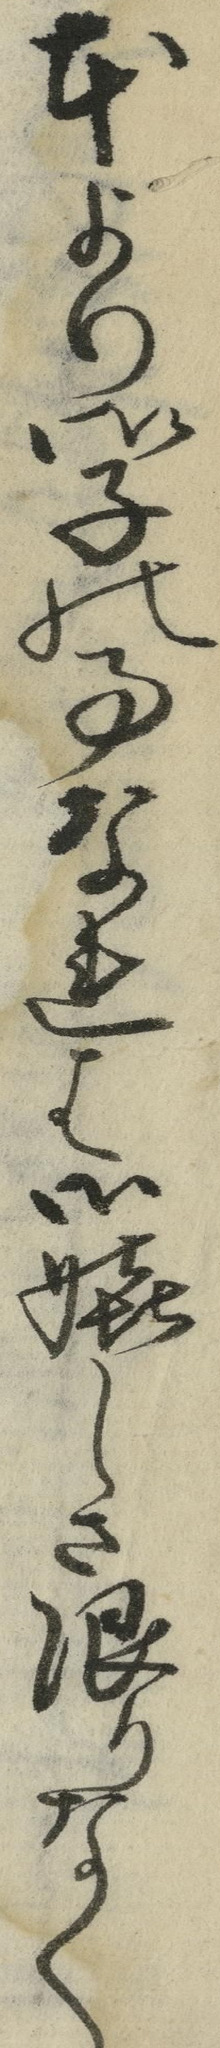本より御子の事なれは御嬉しさ限りなく
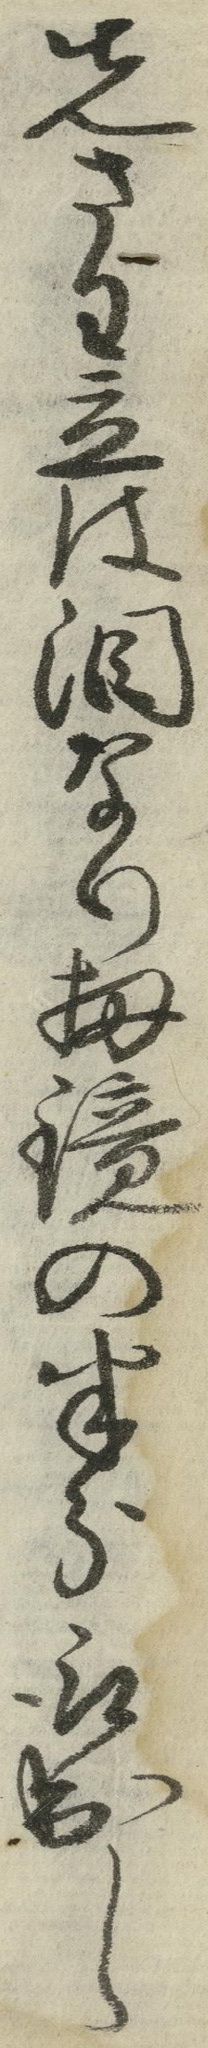先さき立は泪なり扨鏡の半分取出し
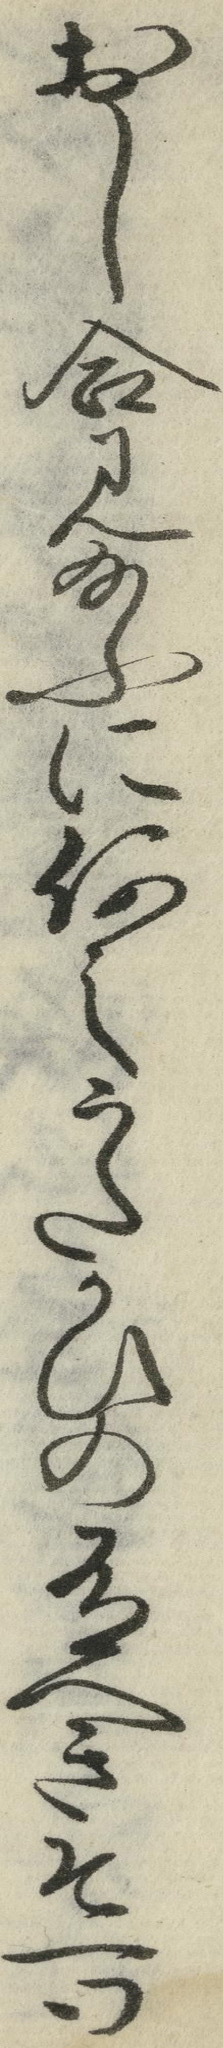おし合見見給ふに何之うたかひの有へきそ一つ
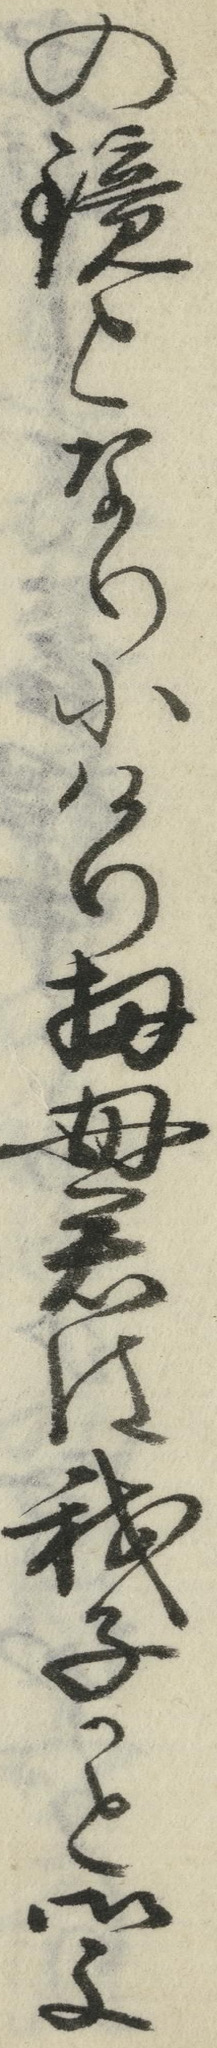の鏡となりにけり扨母君は我子かと御よ
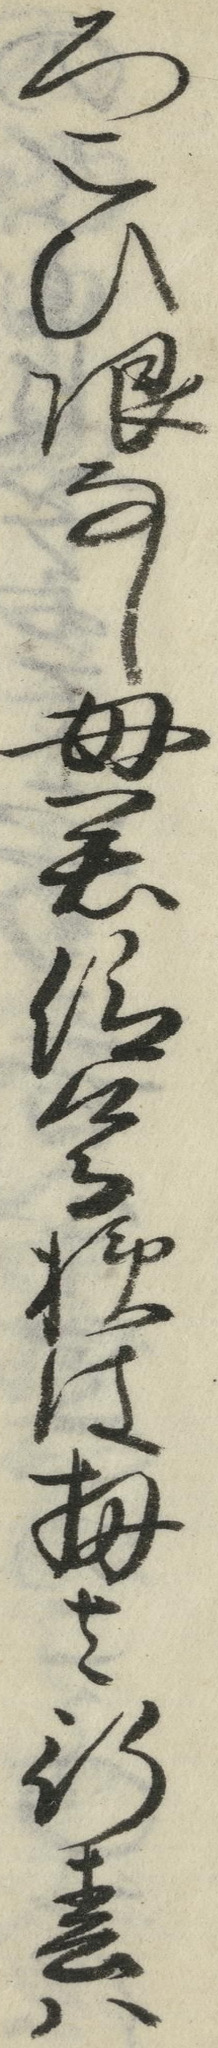ろこひ限なし母君仰ける様は扨は行春ハ
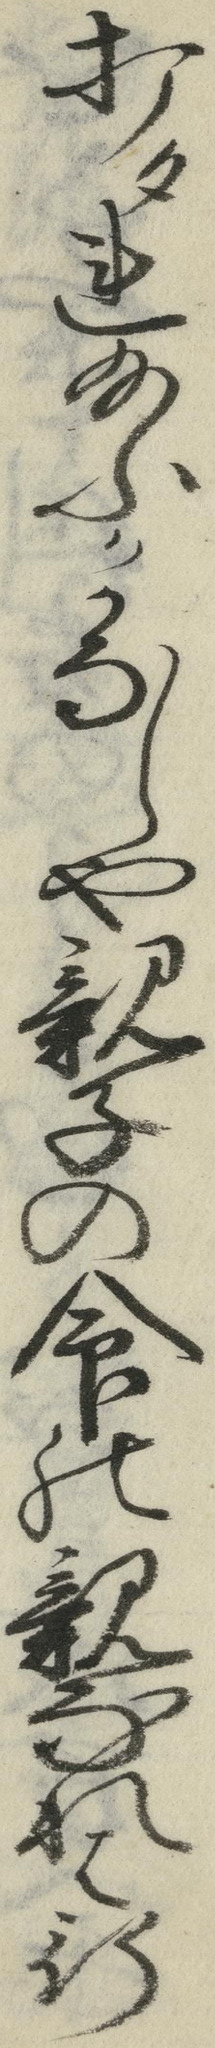打タれ給ふかかなしや親子の命の親なれは行
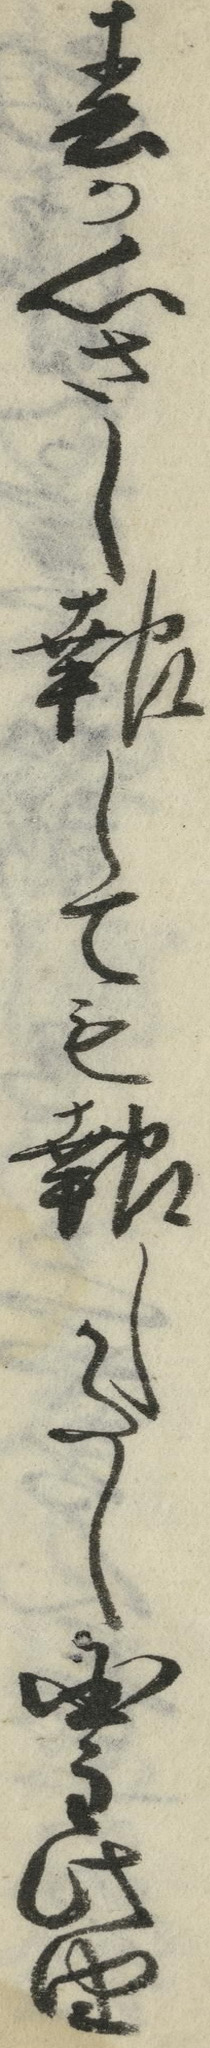春か心さし報しても報しかたし国主此由
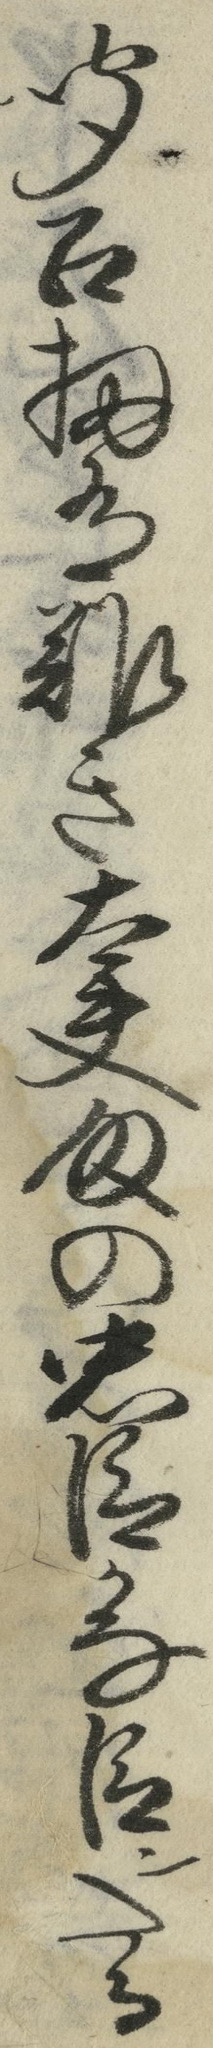聞召扨有難き太夫殿の忠臣かな臣ンたる
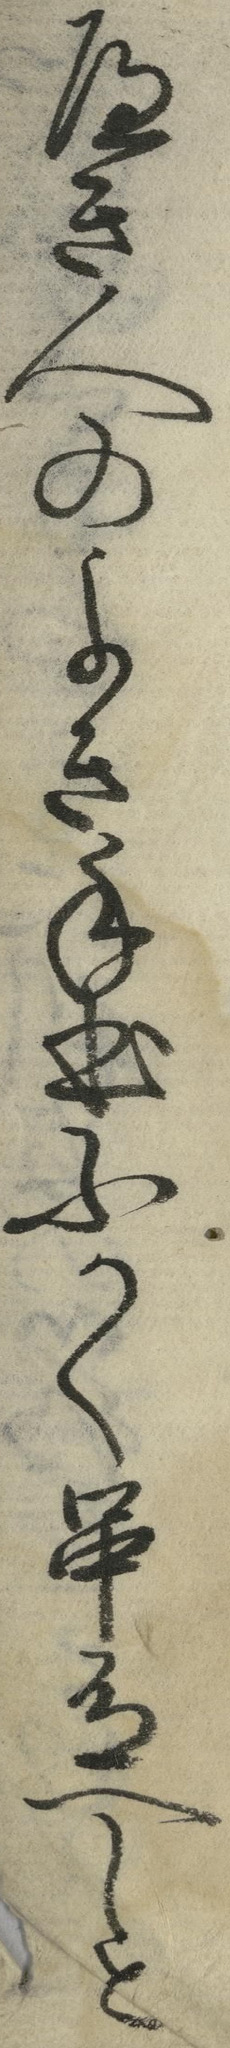へき人のよき手本ふかく弔有へしと

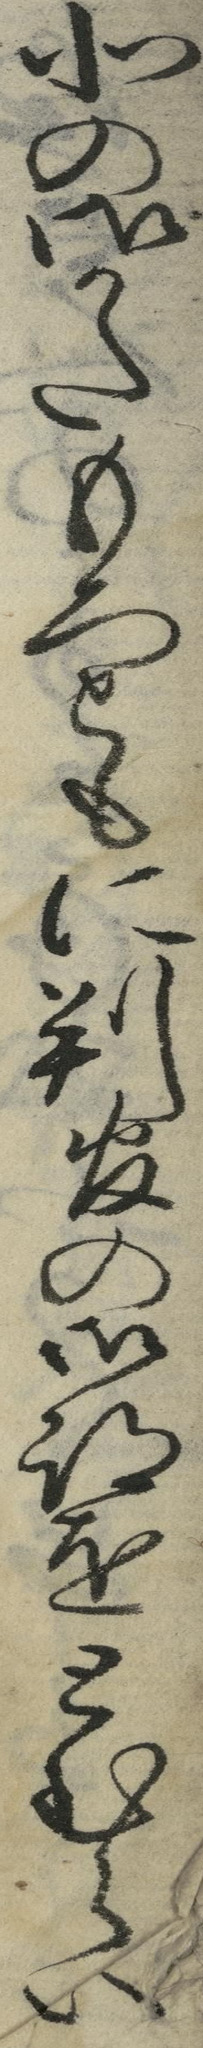北の御かたもろともに判官の御跡をとむらい
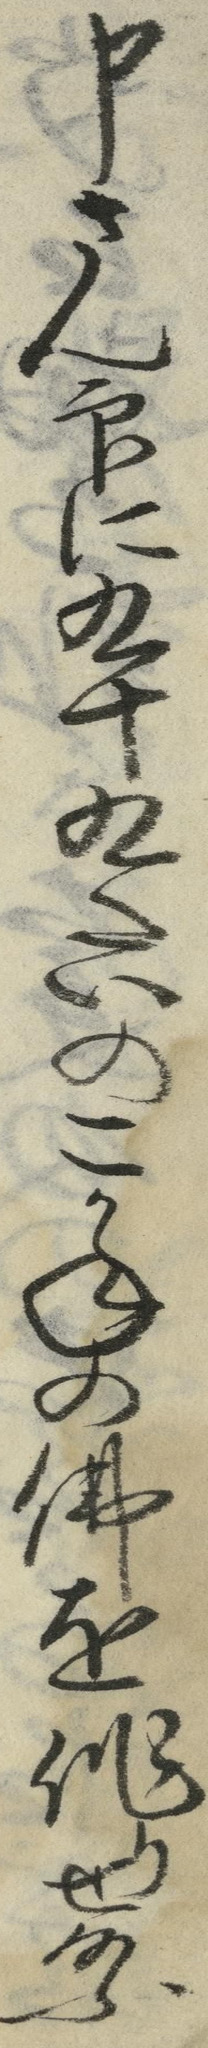申さん印に九十九たいのこかねの佛を作りせ給ふ
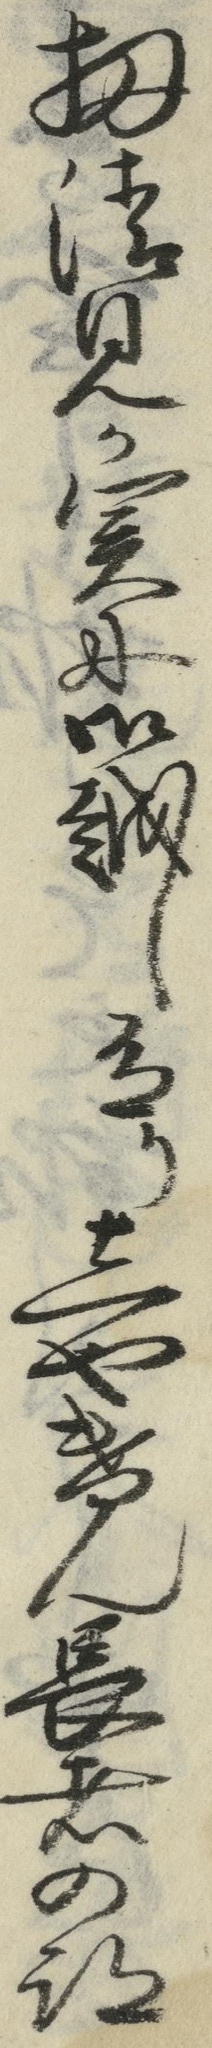扨清見か関に御越し有りしやけん長者の跡
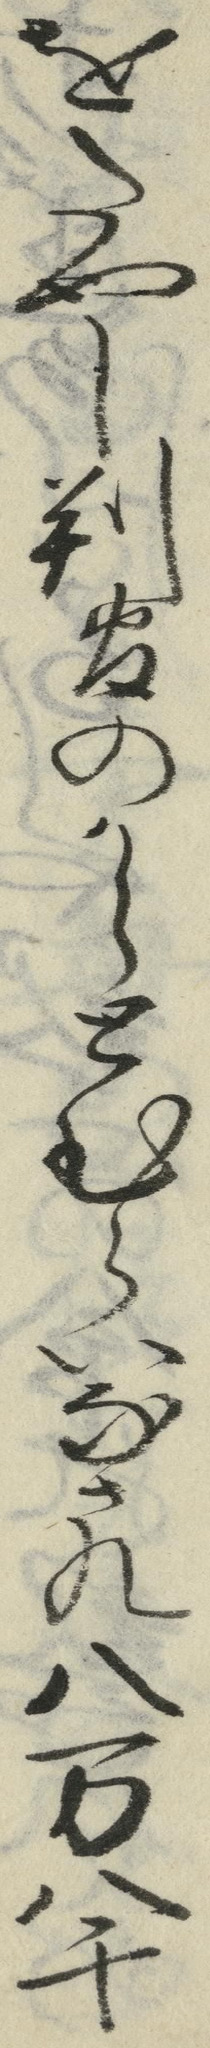をたやし判官のからとむらいなされ八万八千
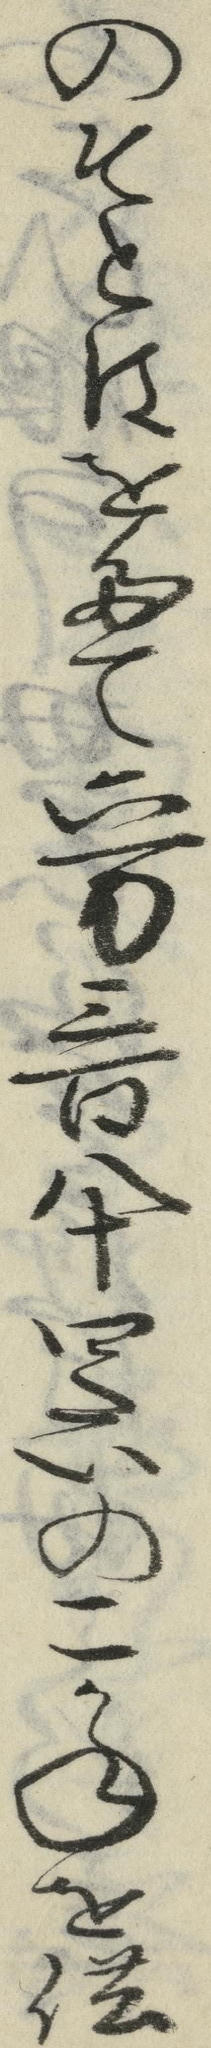のそとはをたて六万三百八十四たいのこかねを供
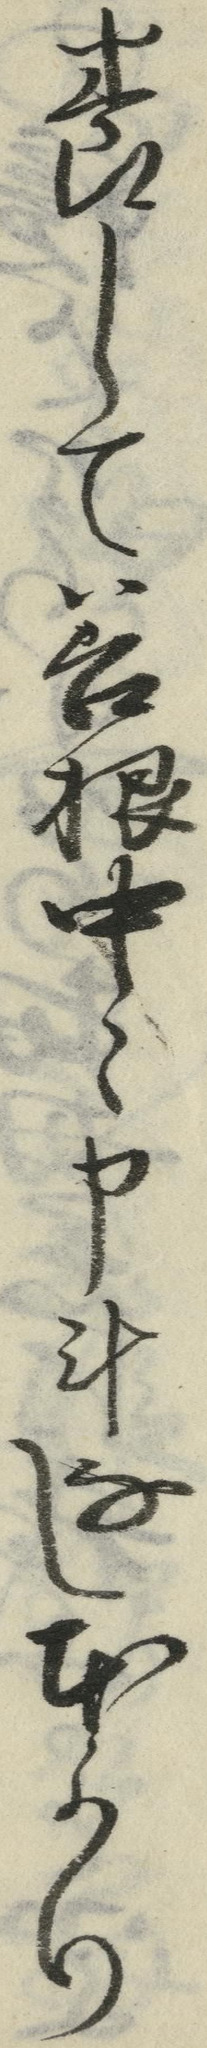養して善根中〻申斗なし本より
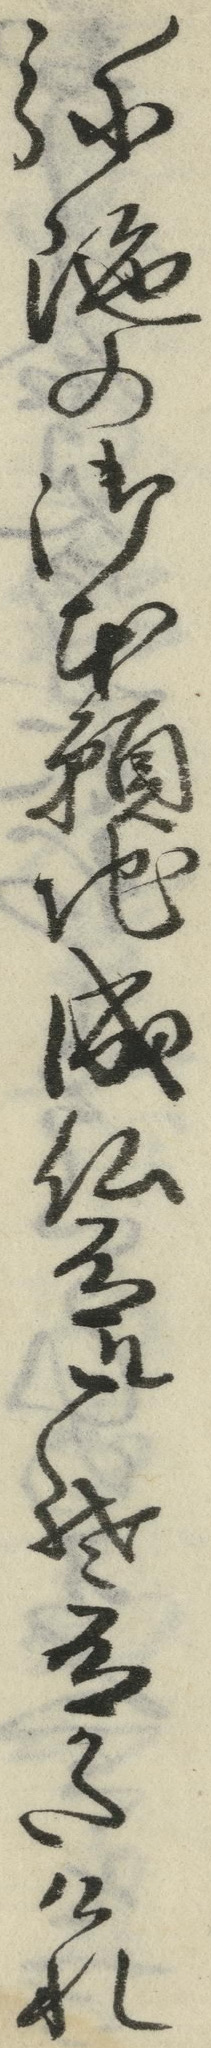弥陀の御本願地成仏有ルこそ有かたけれ
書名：浅間記
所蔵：東京大学地震研究所図書室 Earthquake Research Institute Library, The University of Tokyo, JAPAN
